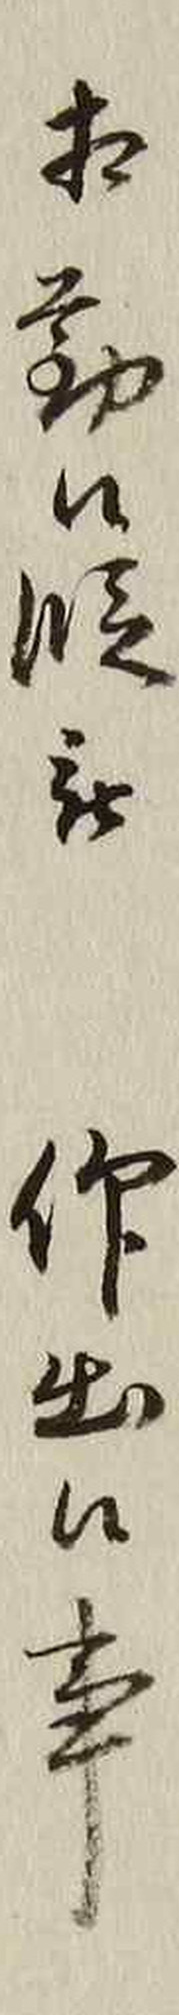相勤候段被仰出候事
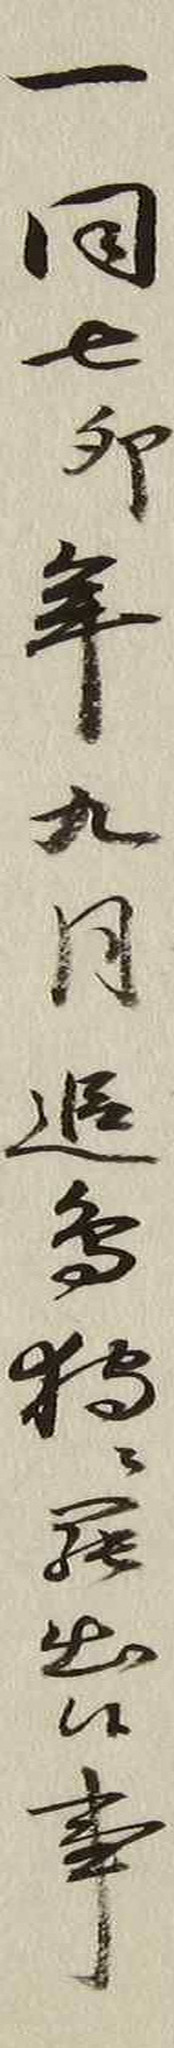一同七卯年九月追鳥狩ニ罷出候事
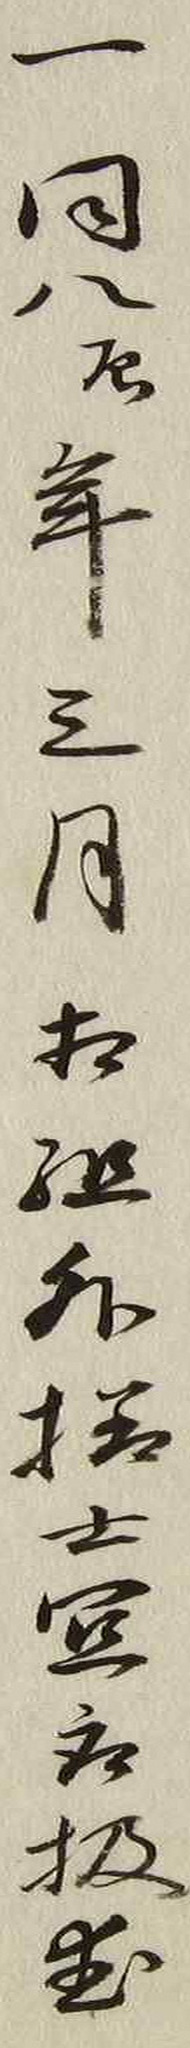一同八辰年三月相組外様士宜取扱武
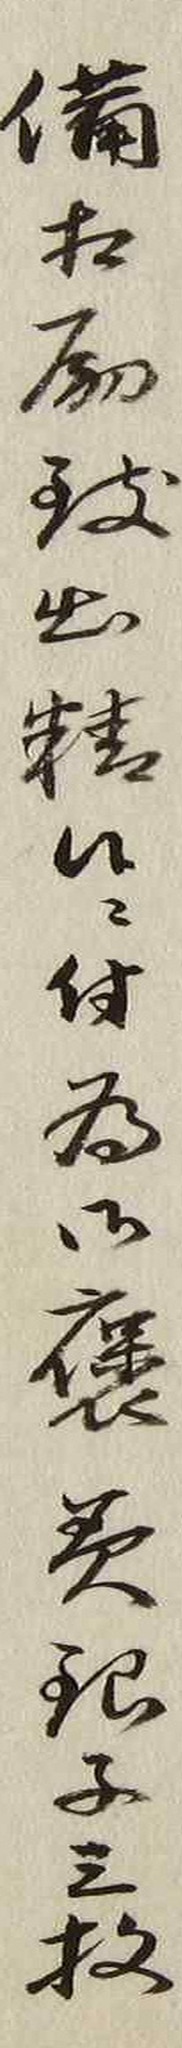備相励致出精候ニ付為御褒美銀子三枚
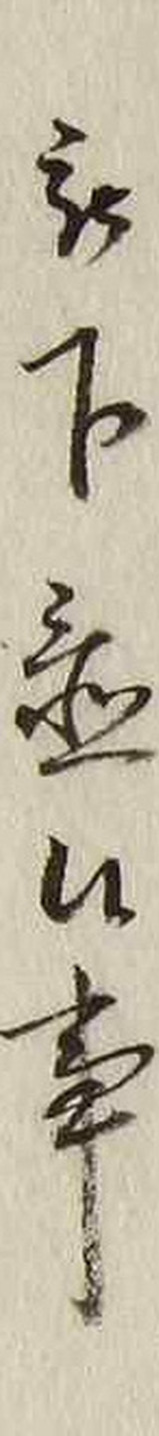被下置候事
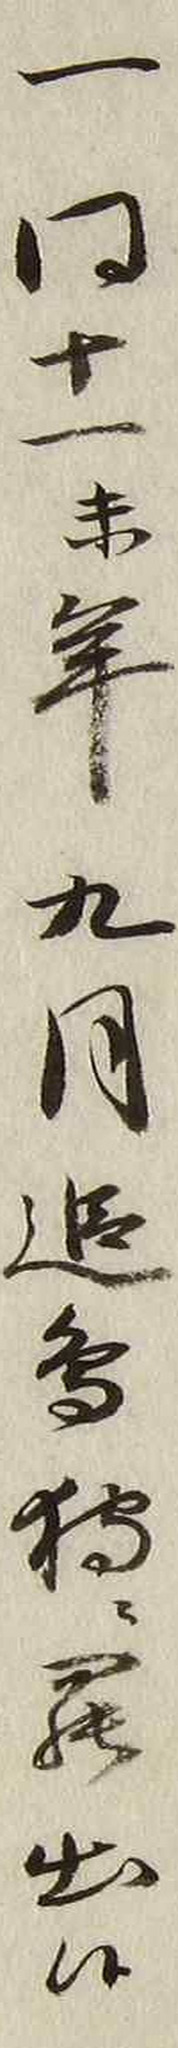一同十一未年九月追鳥狩ニ罷出候
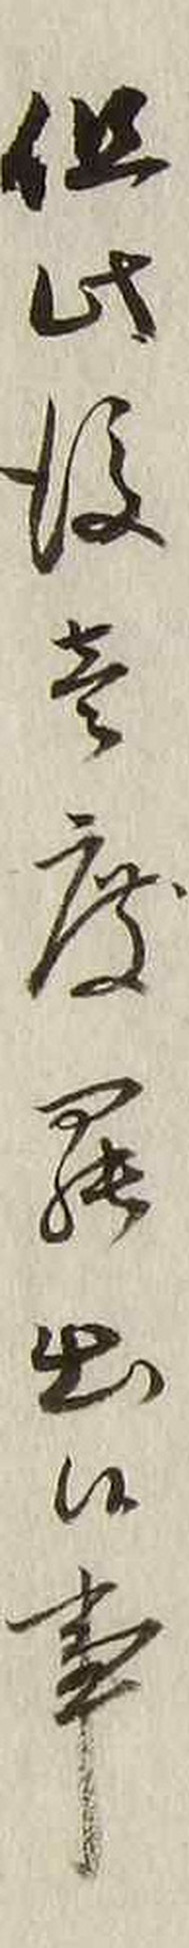但此後壱度罷出候事
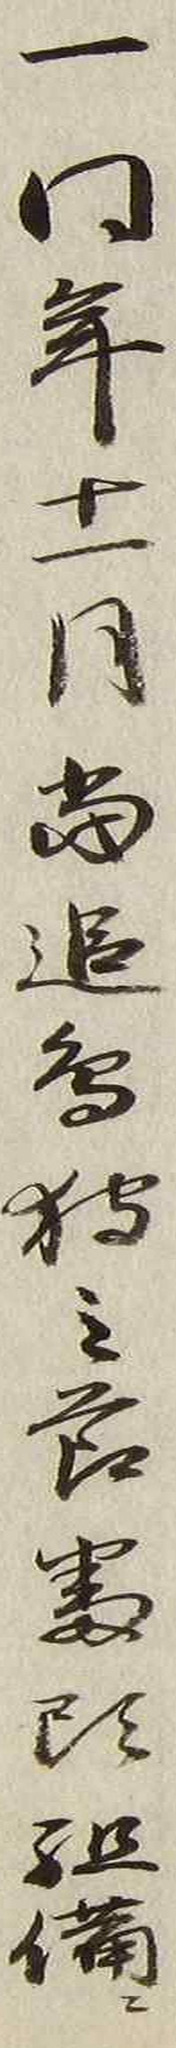一同十一月当追鳥狩之節番頭組備ニ
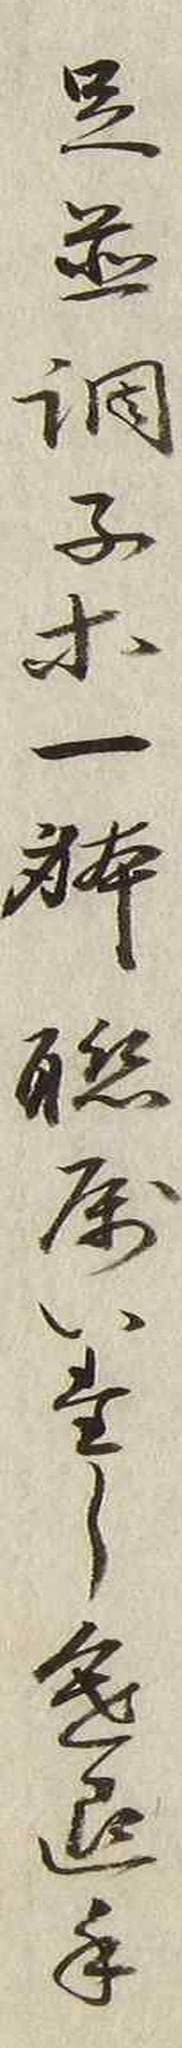足並調子等一体聯属いたし進退手

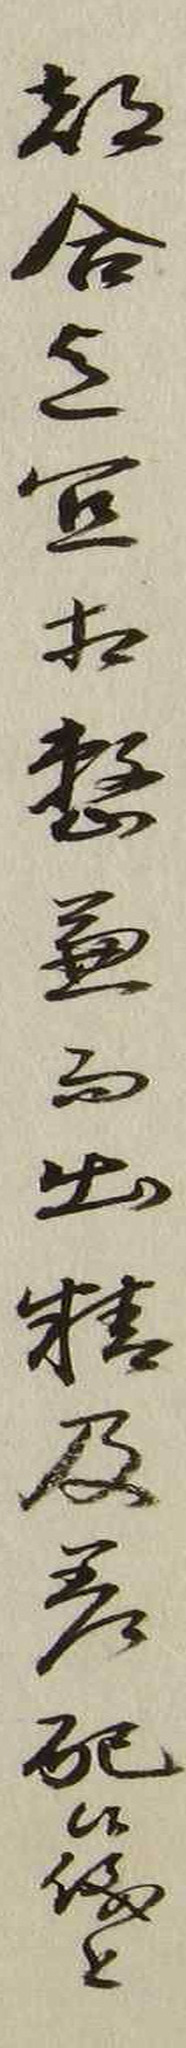都合迄宜相整兼而出精及差配候儀と
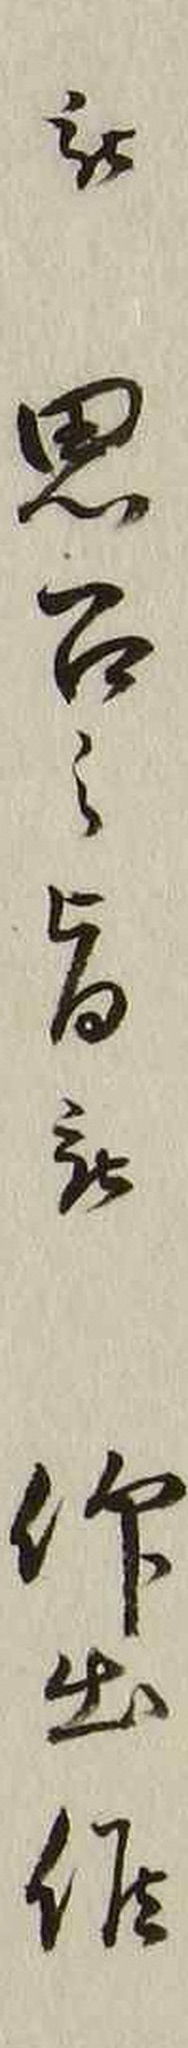被思召之旨被仰出候
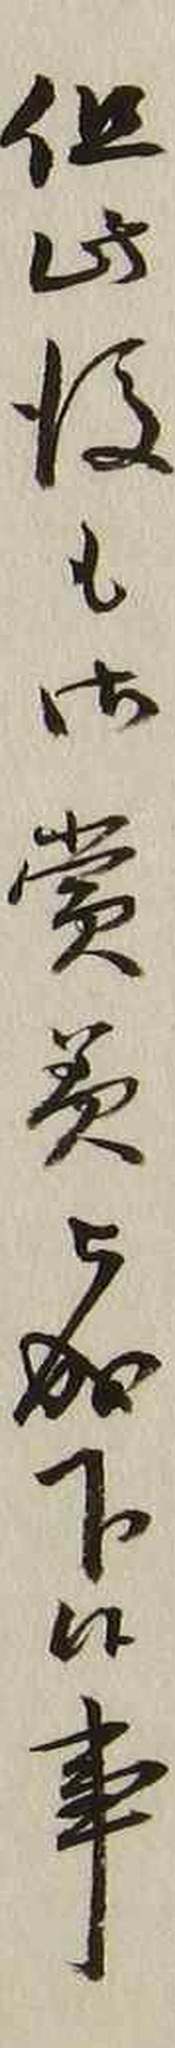但此後も御賞美被成下候事
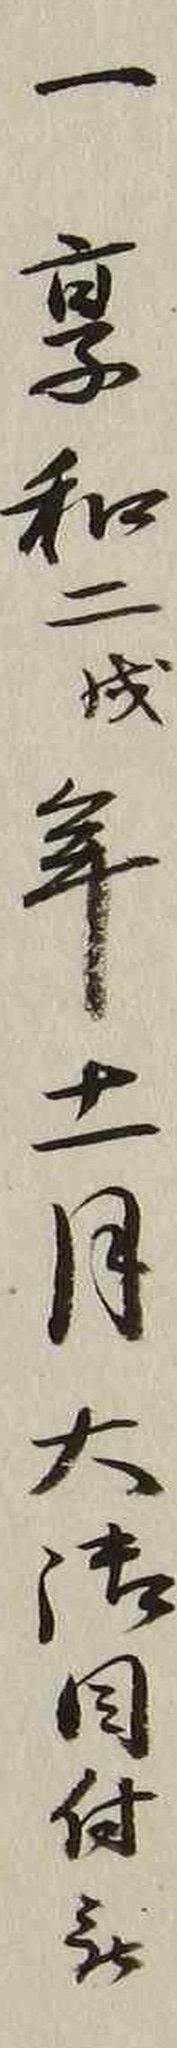一享和二戌年十一月大御目付被
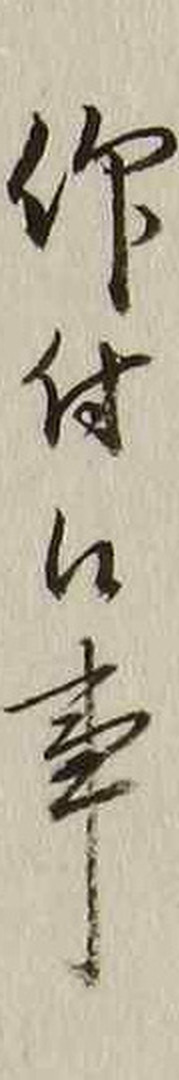仰付候事
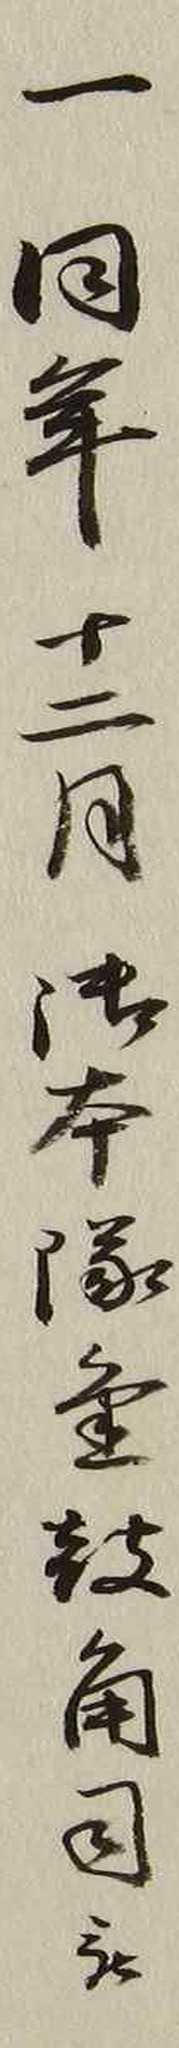一同年十二月御本隊重鼓角司被
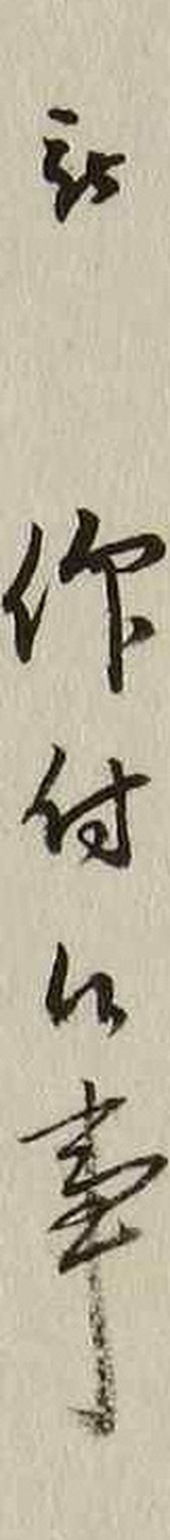被仰付候事
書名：諸士系譜　巻之160　な之部2
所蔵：会津若松市立会津図書館
